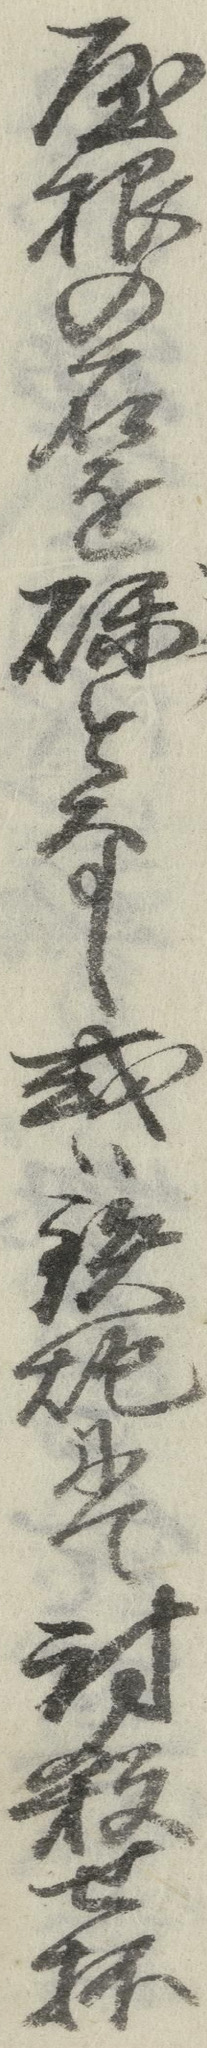屋根の石を礫となし或は鉄炮にて討殺せ抔
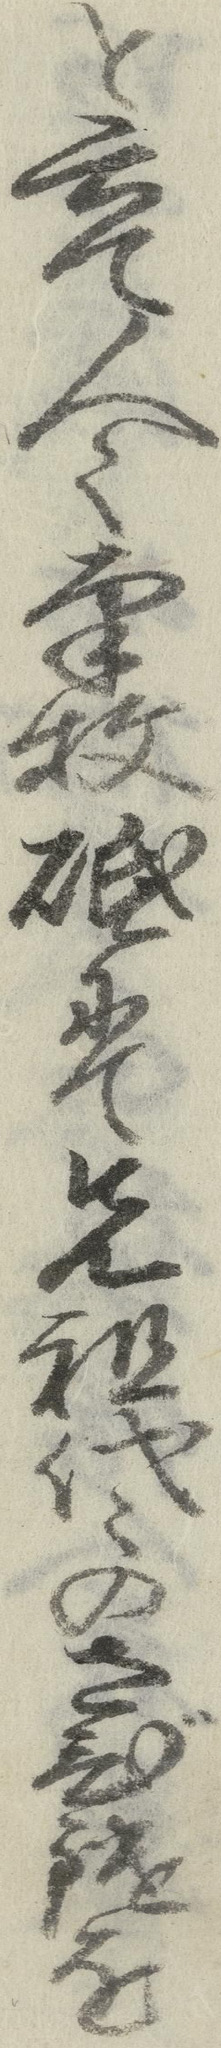と云て人々南牧砥にて先祖代々のさび鑓を

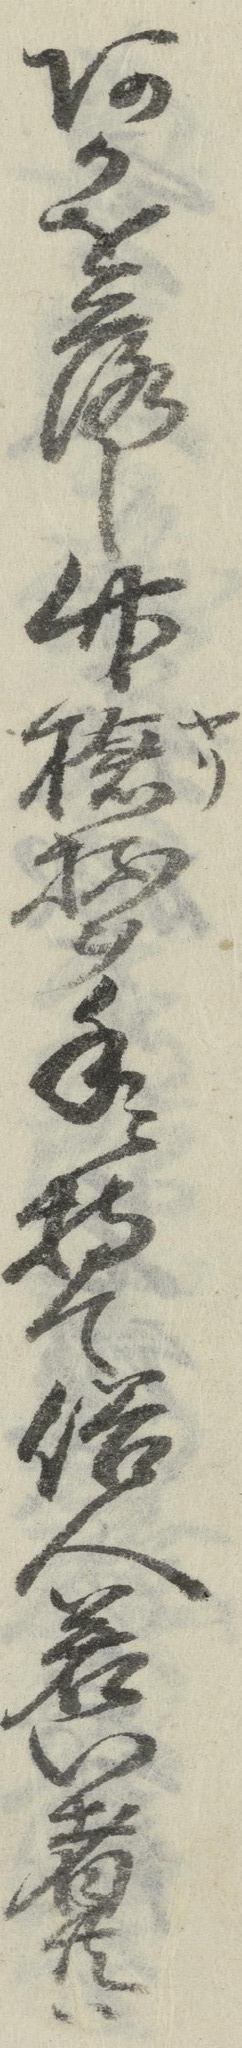あかを落し竹槍抔ヲ手に持て俗人善い者共は
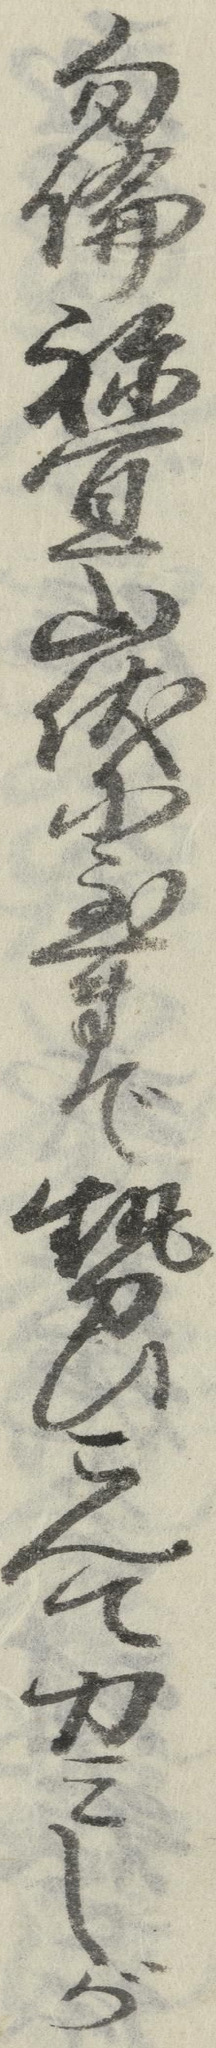勿論祢宜山伏に至まで勢ひこんて力みしが
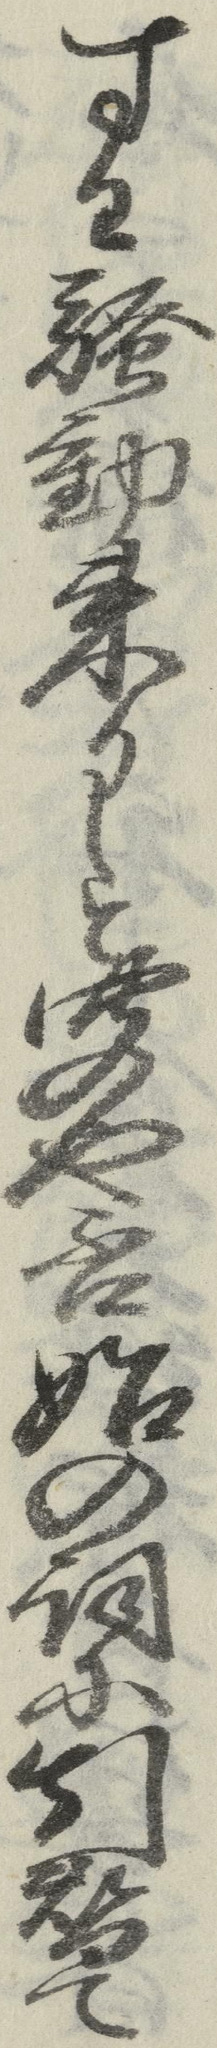すわ騒動来りしと聞や否始の詞に引替て
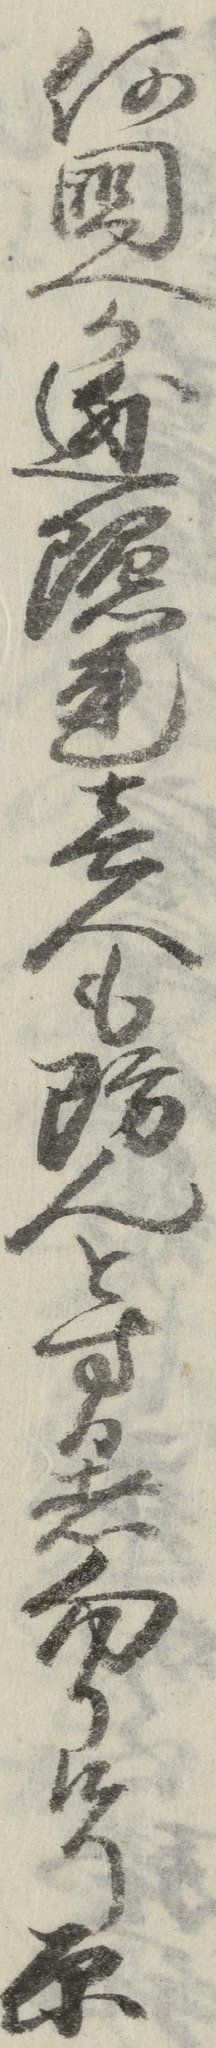何国へか迯隠れ壱人も防んとする者勿りけり原
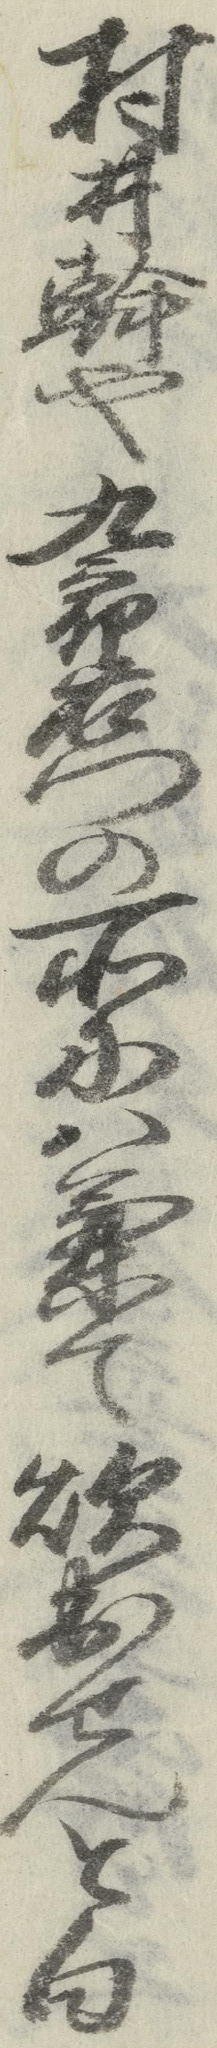村井斡や九郎右衛門の所には兼て炊出せんと白
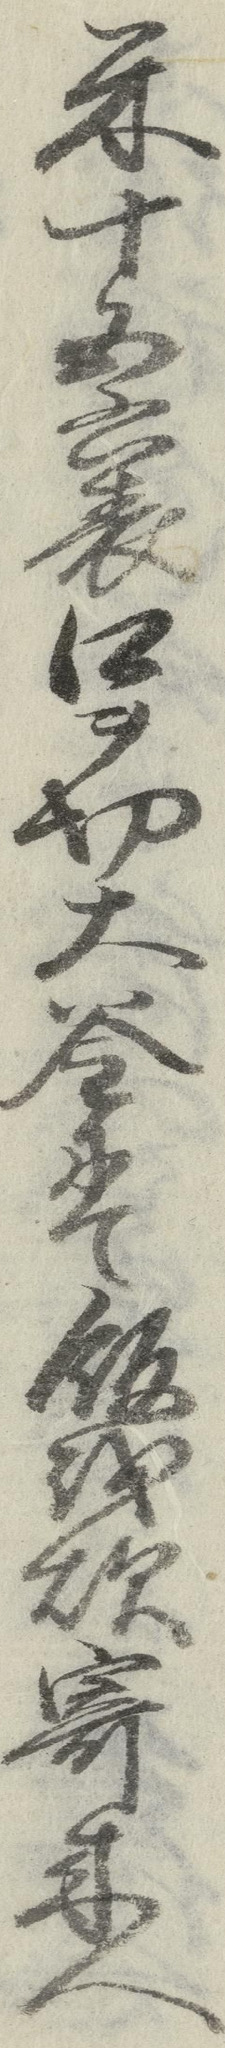米十五六表口ヲ切大釜にて飯を炊寄来人
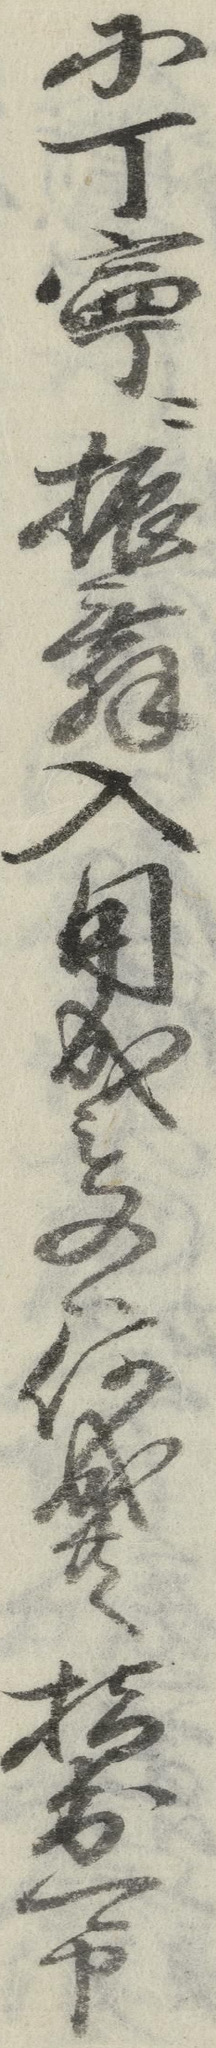に丁寧に振舞入用成ものは何成共指出可申
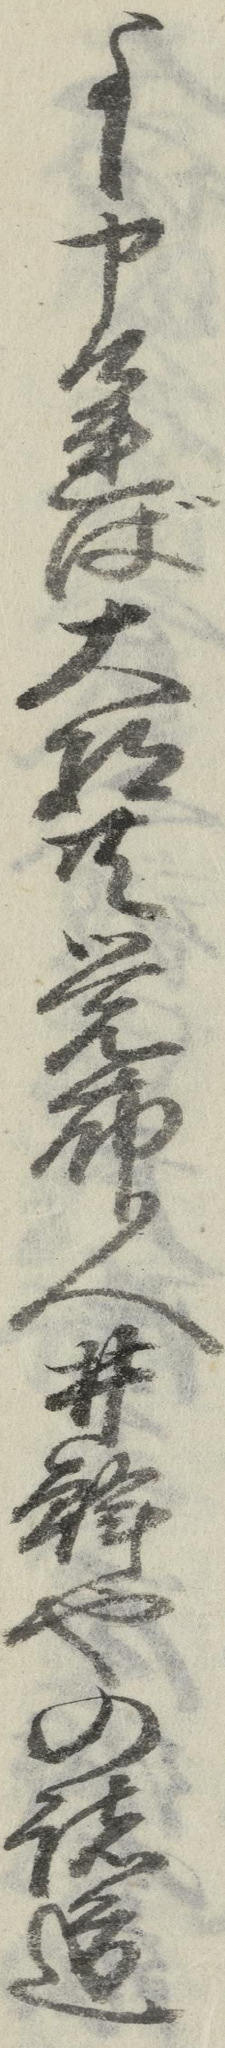よし申ければ大持共覚布り人井斡やの諸道
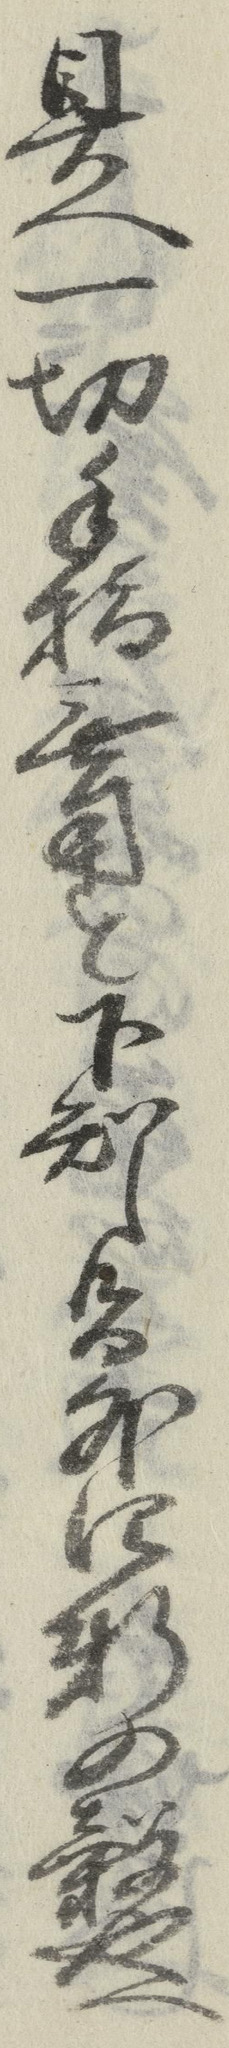具一切手指無用と下知しける外四軒の穀やへ
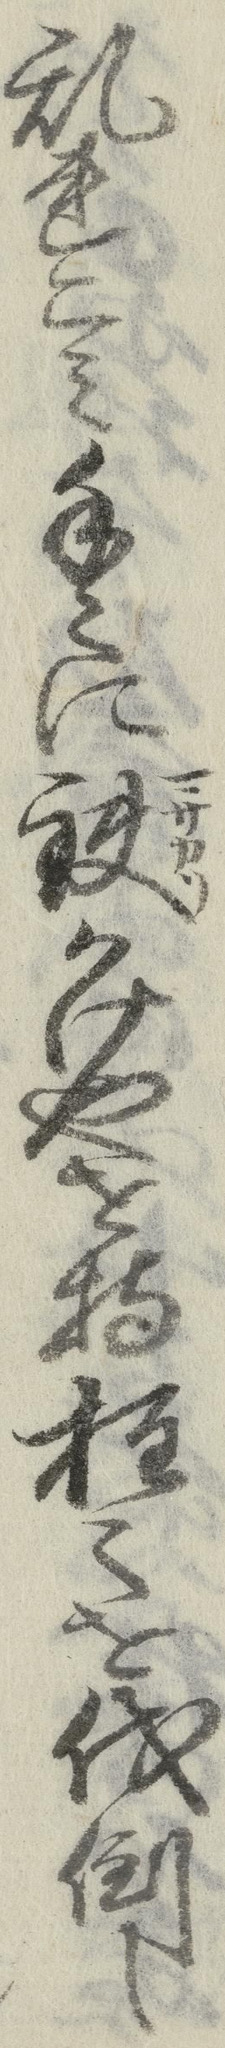乱れこみ手々に鈇かけやを持柱々を伐倒し
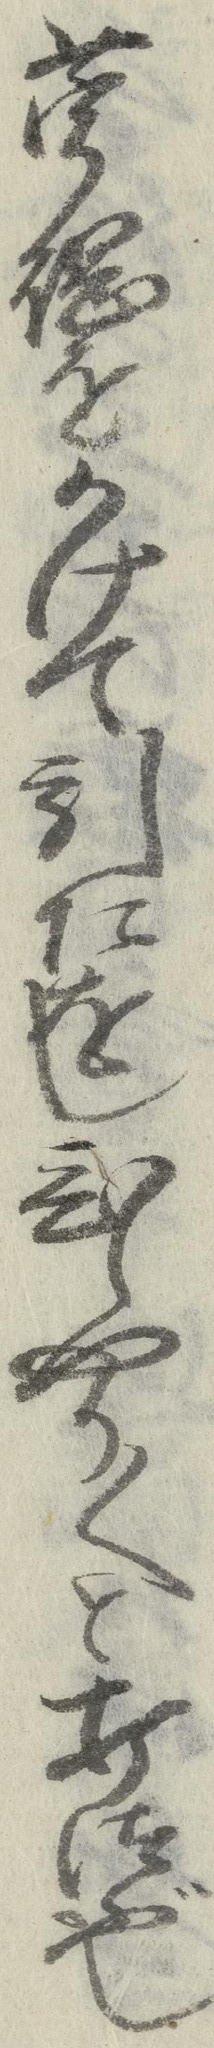荢綱をかけて引たをしひしやり〳〵と打うぶし
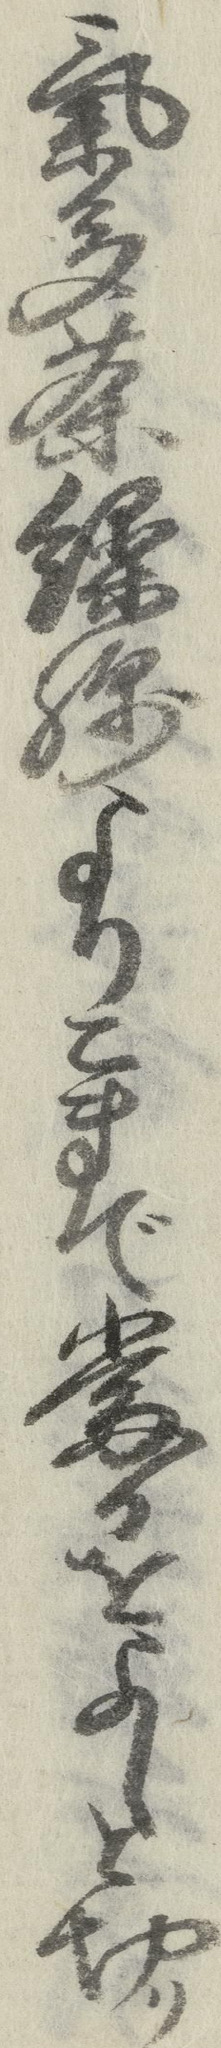気多茶繰練よりこまで當かをよしと切り
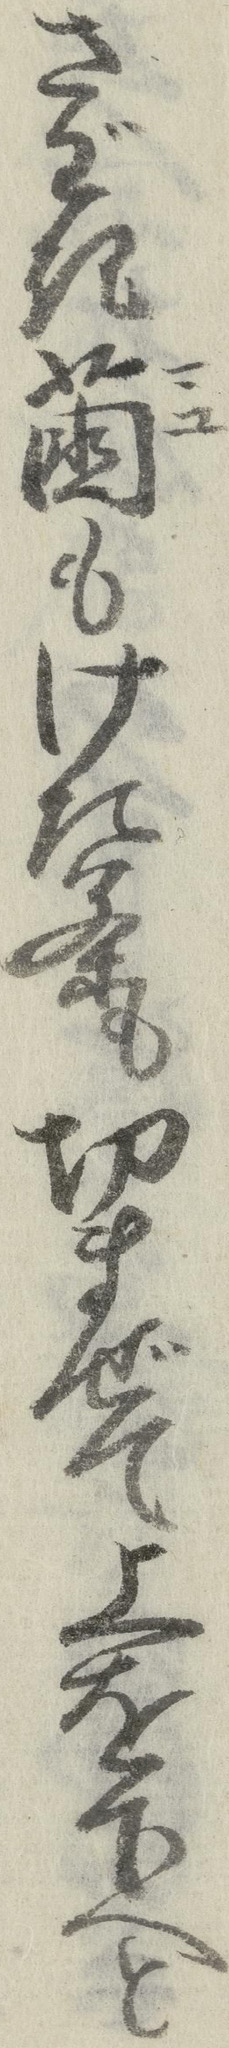さばき繭もけた条も切まぜて上を下へと
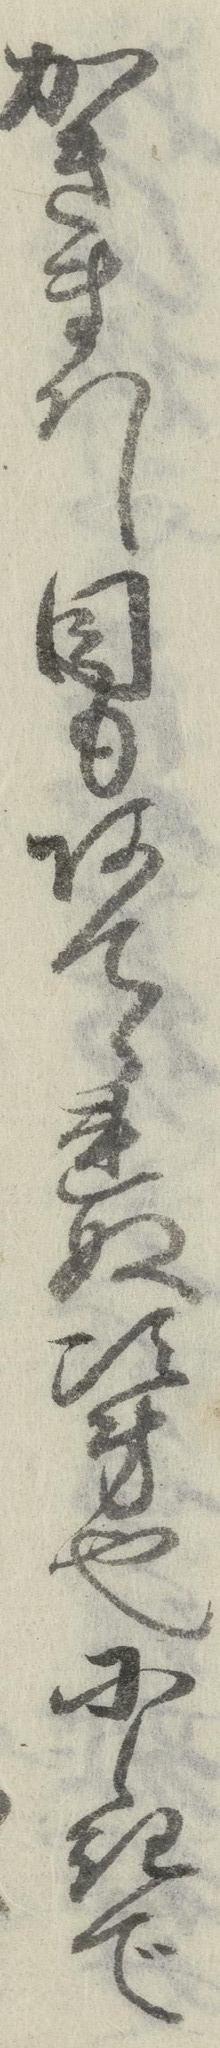かきまわし目もあてられぬ次第也にしきで
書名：浅間大焼騒動記　中
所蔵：東京大学地震研究所図書室 Earthquake Research Institute Library, The University of Tokyo, JAPAN
